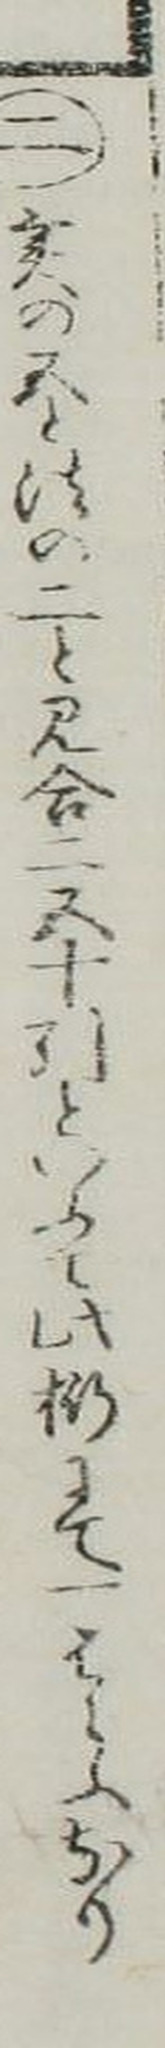㊁実の五と法の二と見合二五十引といふて此桁にて一はらふなり
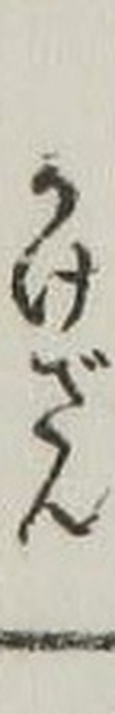かけざん
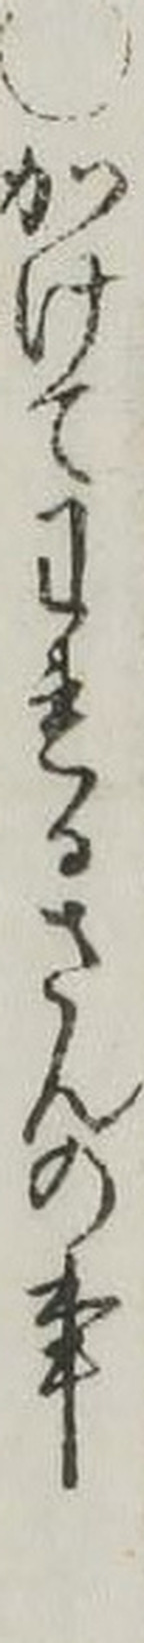○かけてわれるさんの事
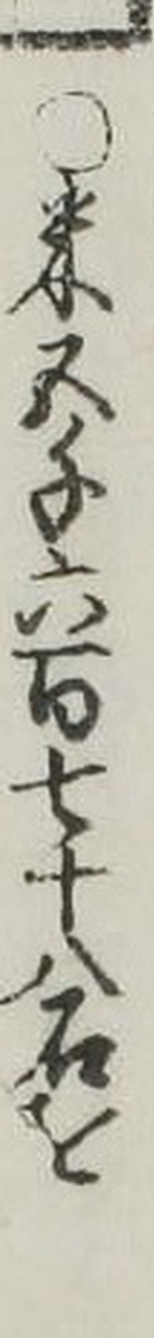○米五千六百七十八石を
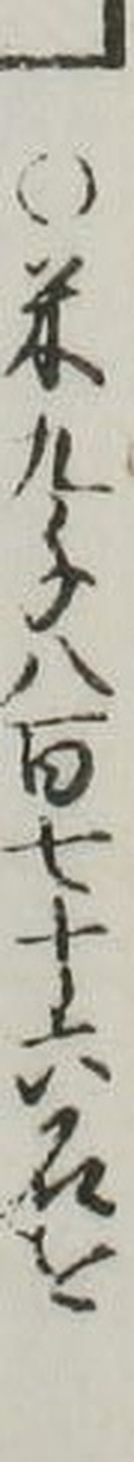○米九千八百七十六石を
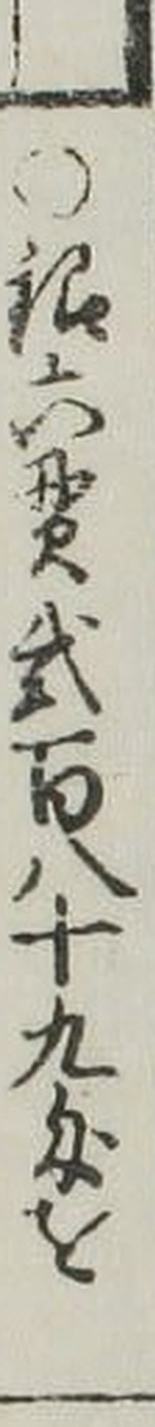○銀六貫弐百八十九匁を
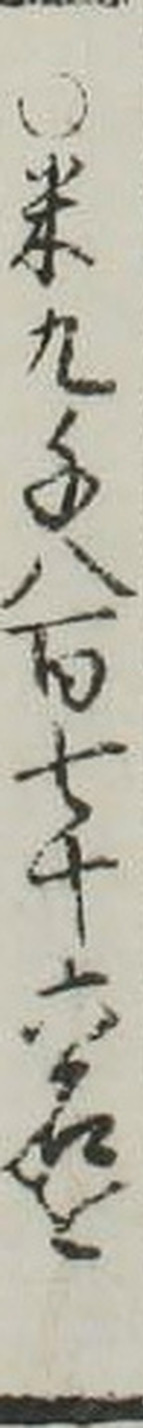○米九千八百七十六石を
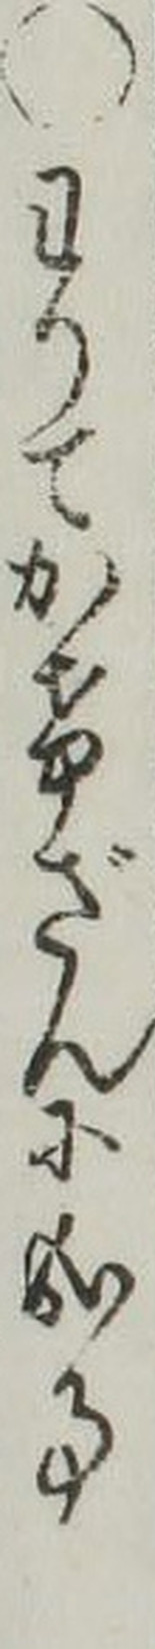○わりてかけざんに成事
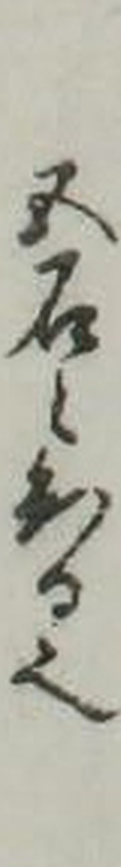五石と知る也

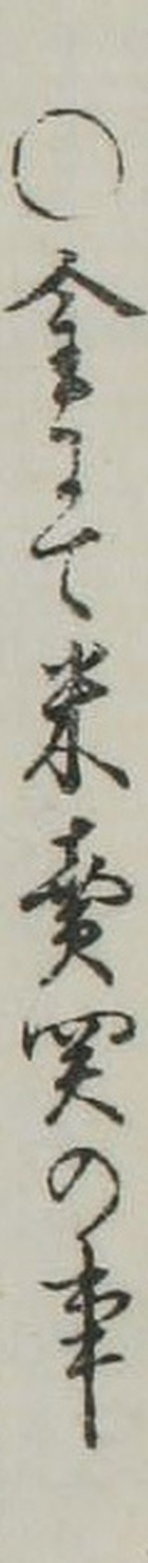○金にて米売買の事
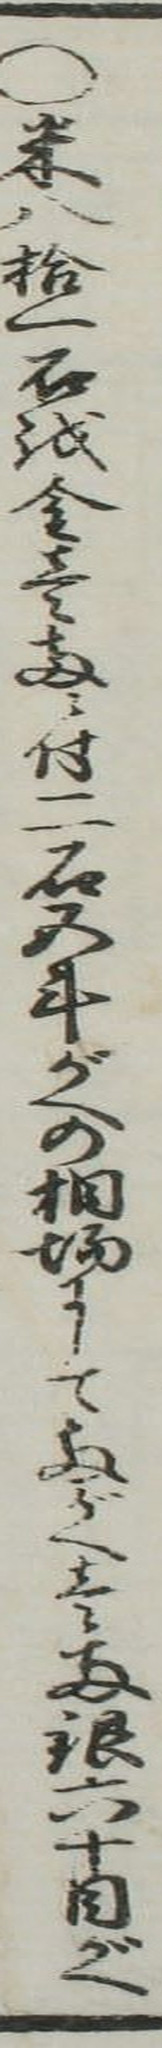○米八拾一石を金壱両に付二石五斗がへの相場にて両がへ壱両銀六十目がへ
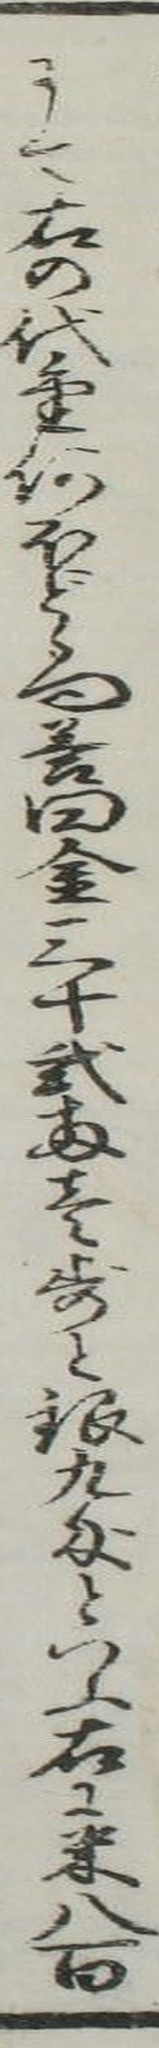にて右の代金何ほどゝ問答曰金三十弐両壱歩と銀九匁といふ右に米八百
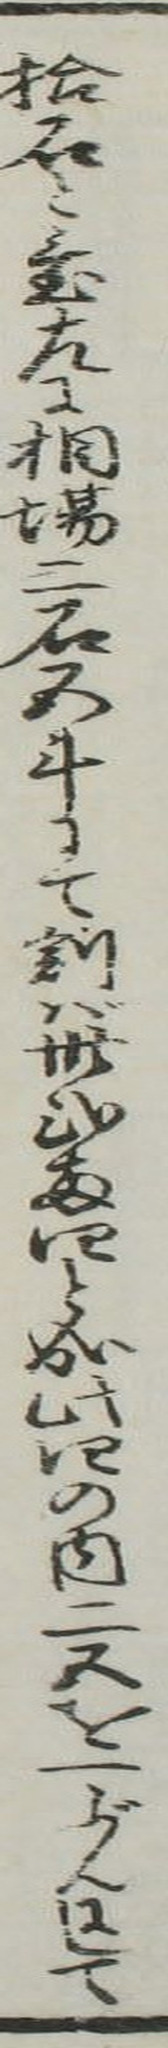拾石と置左に相場二石五斗にて割ば卅弐両四と成此四の内二五を一ぶんにして
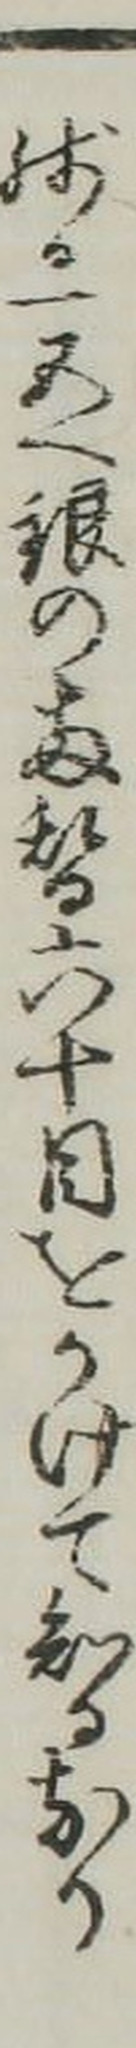残る一五へ銀の両替六十目をかけて知なり
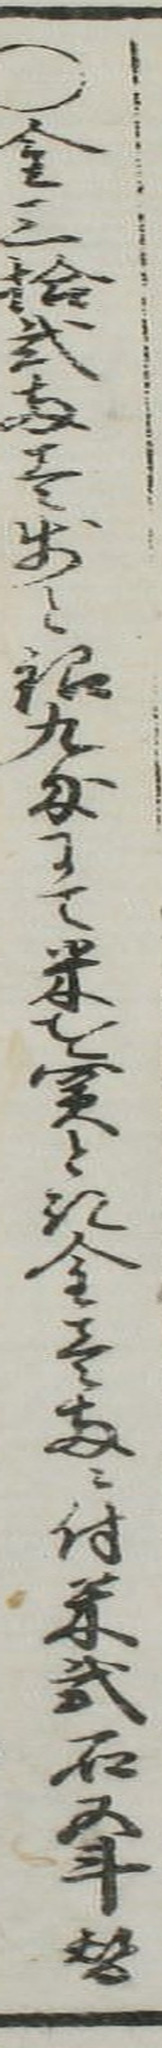○金三拾弐両壱歩と銀九匁にて米を買とき金壱に付米弐石五斗替
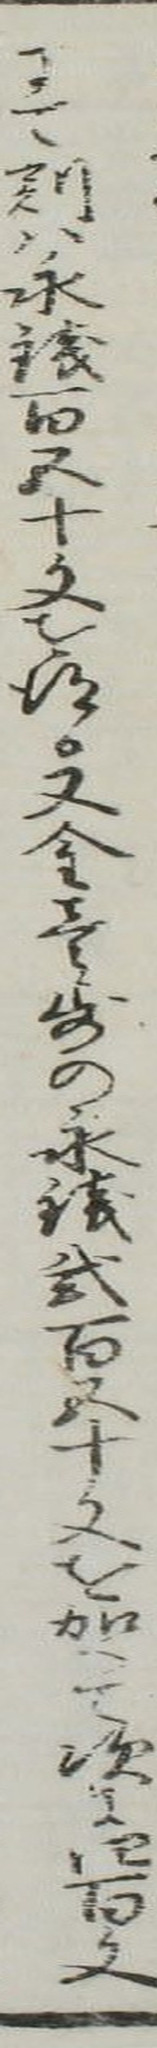にて割は永銭百五十文を得る又金壱歩の永銭弐百五十文を加へて次に四百文
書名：宝玉塵劫記
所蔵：東京学芸大学教育コンテンツアーカイブ
